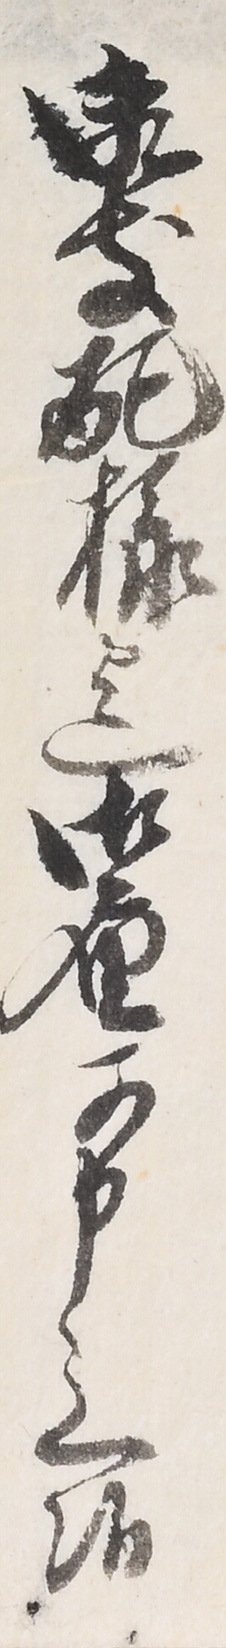御支配様迄御届可申上候
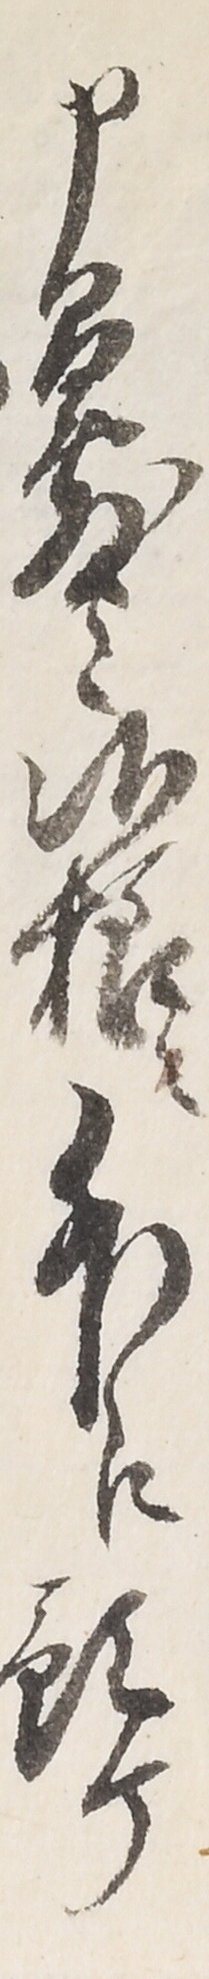申間敷ニ候様ニ外え預ケ
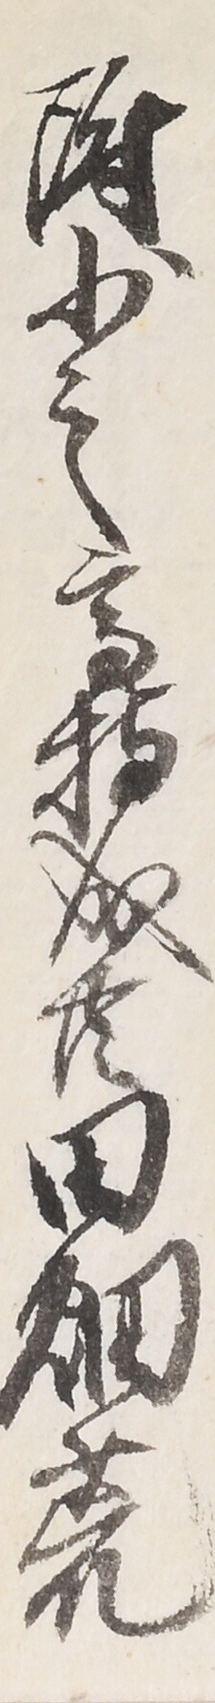附少之高持成共田畑荒
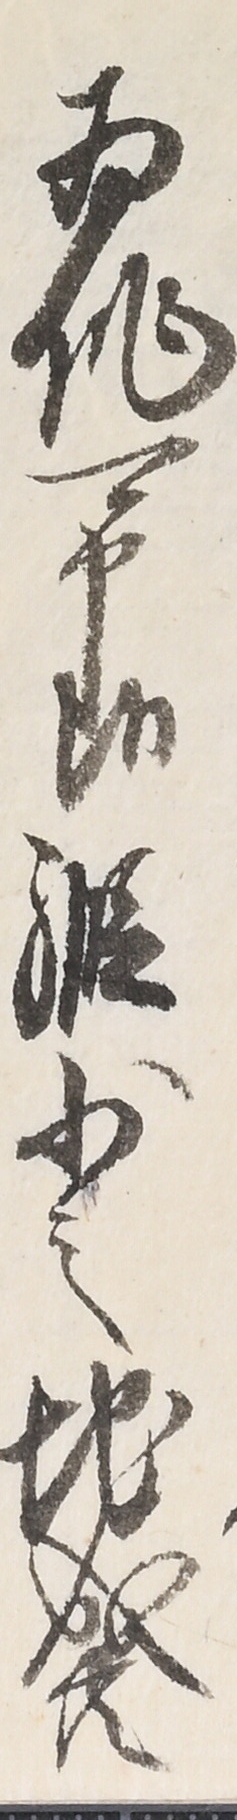為作可申候縦少之地成共
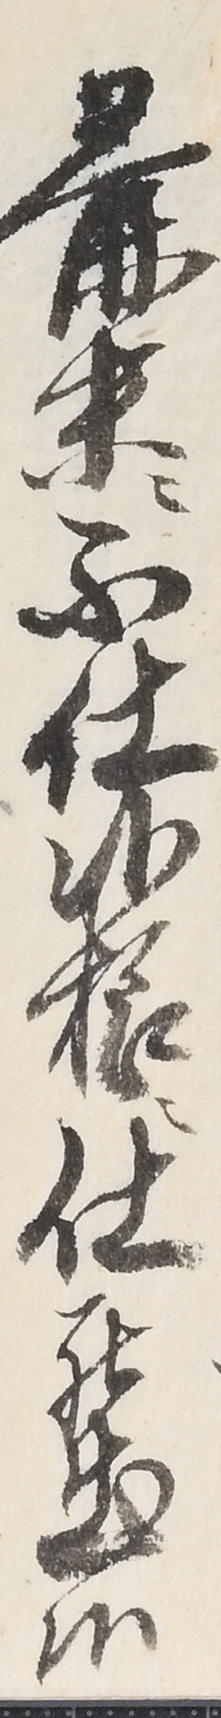麤末ニ不仕候様ニ仕罷出候
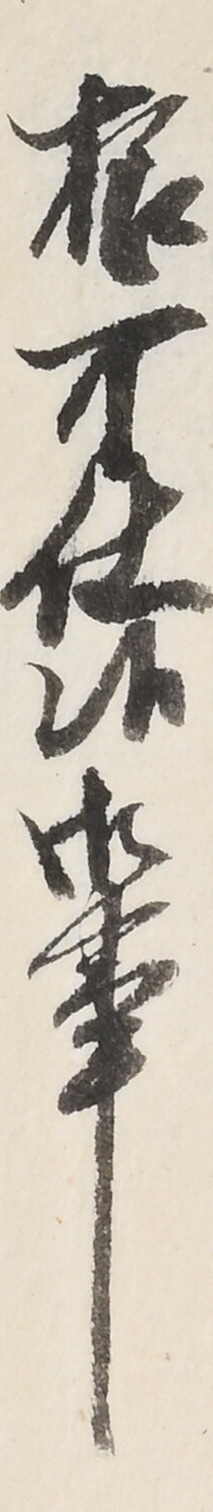様可仕候御事
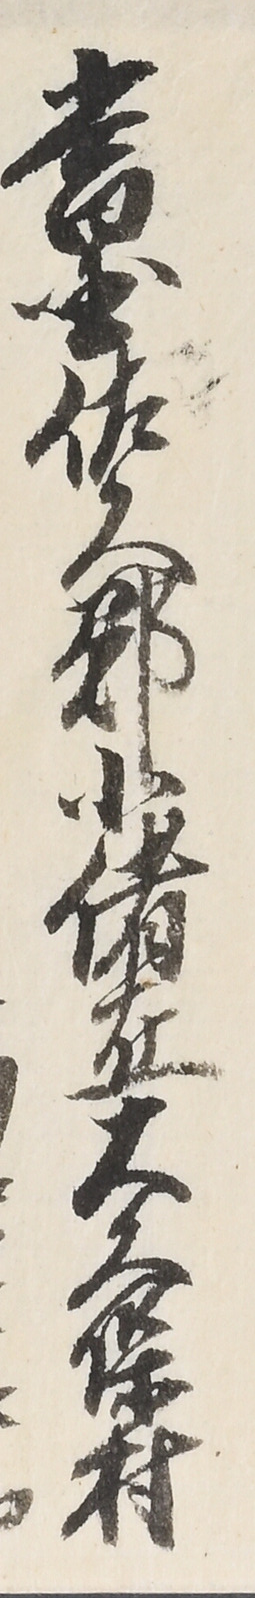当国佐久郡小諸在大久保村
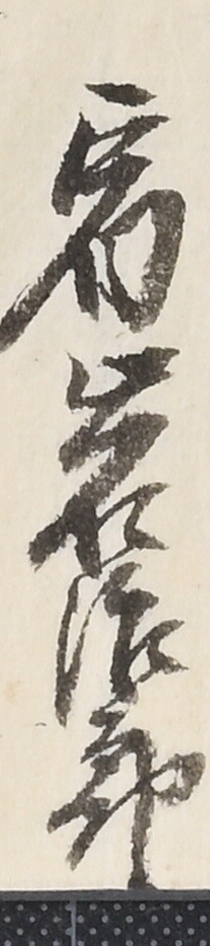宿岩治郎

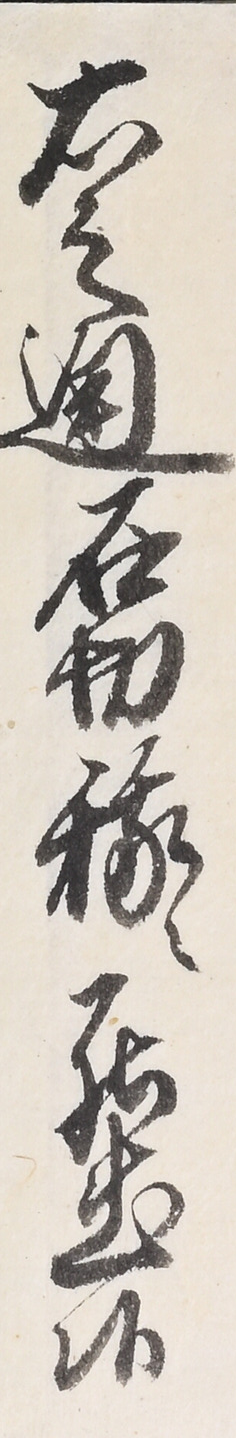右之通石切稼ニ罷出候
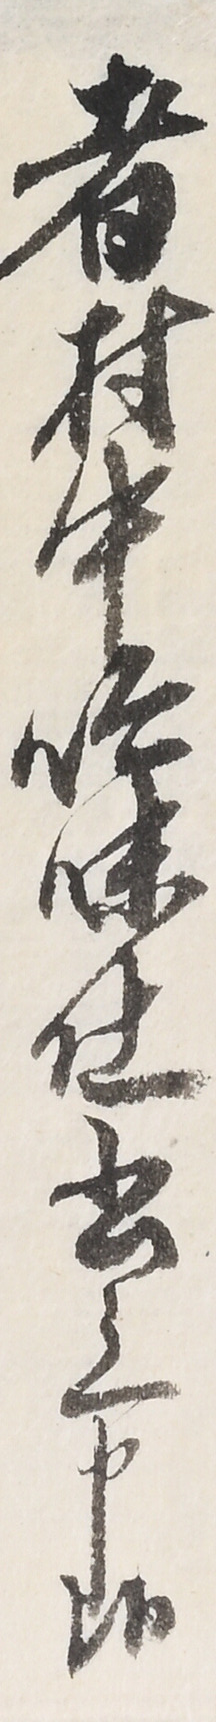者村中吟味仕書上申候
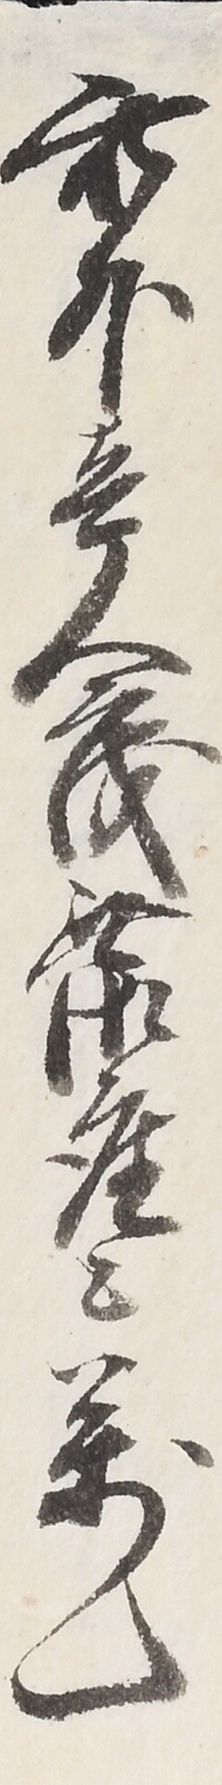此外壱人も無御座候万一
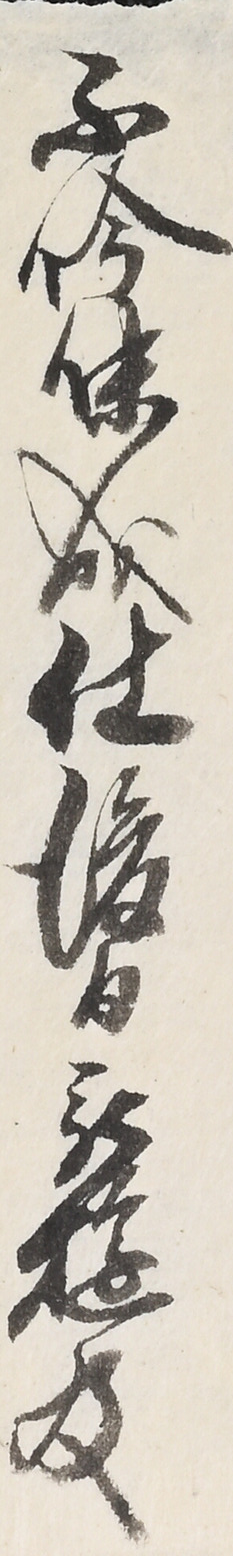不吟味成仕後日被遊及
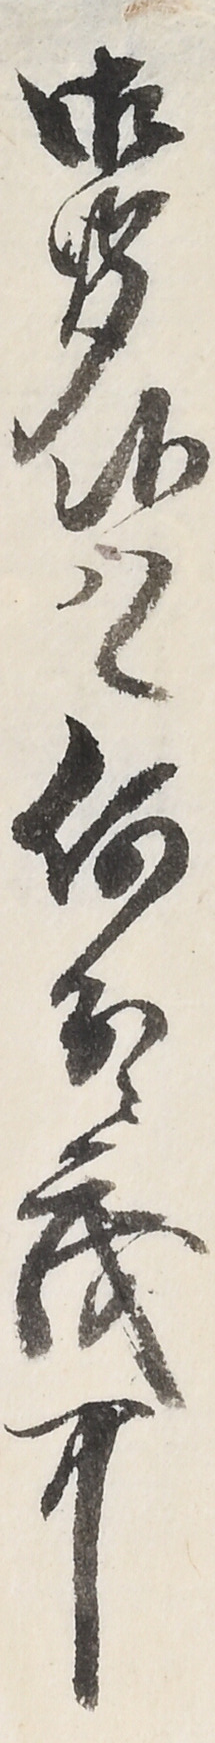御聞候ハヽ何分ニも可
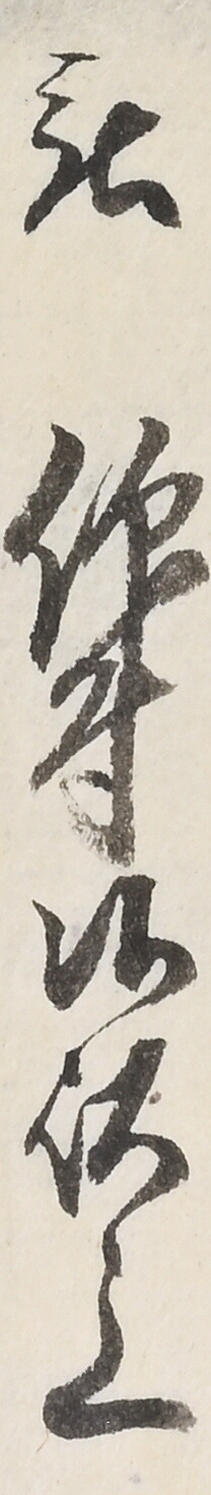被仰付候以上
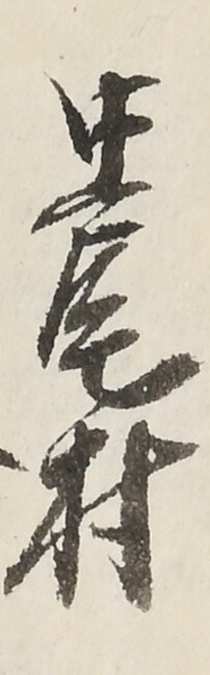中尾村
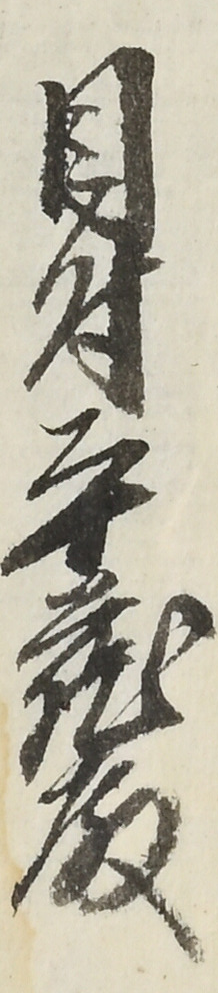目附平蔵殿
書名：萬延二辛酉年正月石切旅稼名前書上帳
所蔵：伊那市立高遠町図書館・合同会社AMANE
